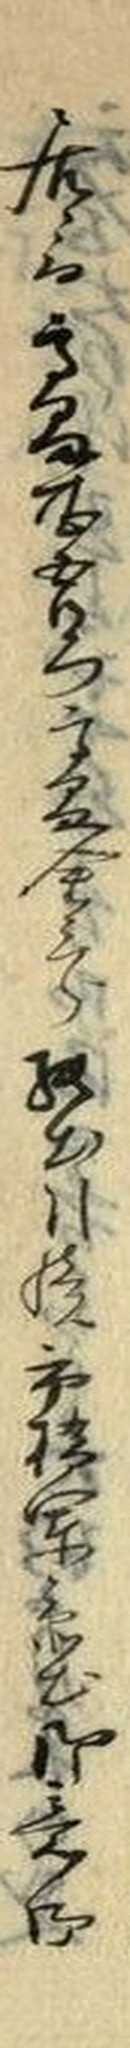居ニ而高畠甚五左衛門高畠金三郎罷出引続市橋軍兵衛出御意御

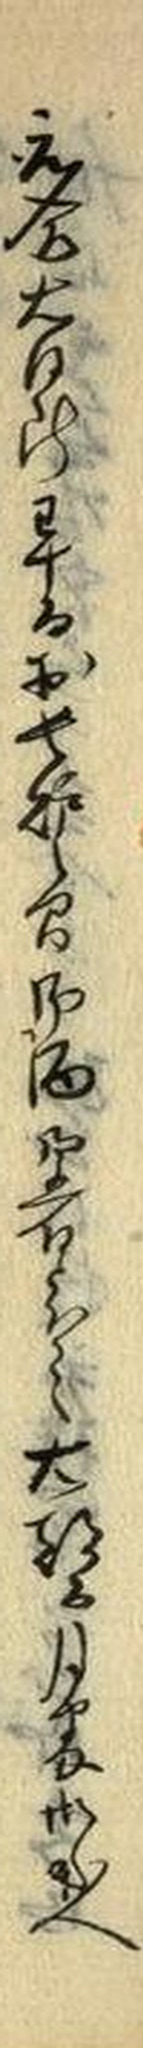取合右同断畢而於長炉之間御酒御肴被下之右都而月番御用人
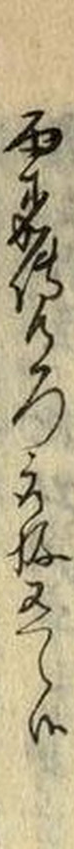雨森伝左衛門取扱有之候
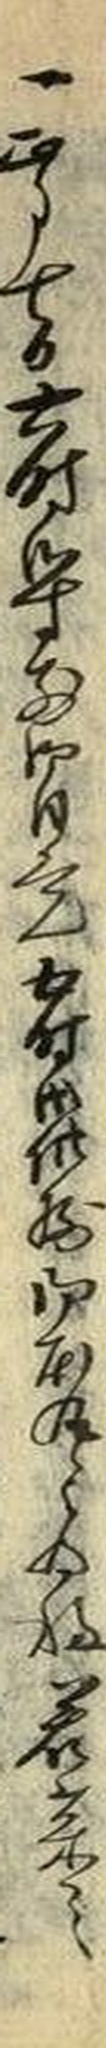一正月七日六時弐寸前御目覚五時御供揃御本丸へ被為移若菜之
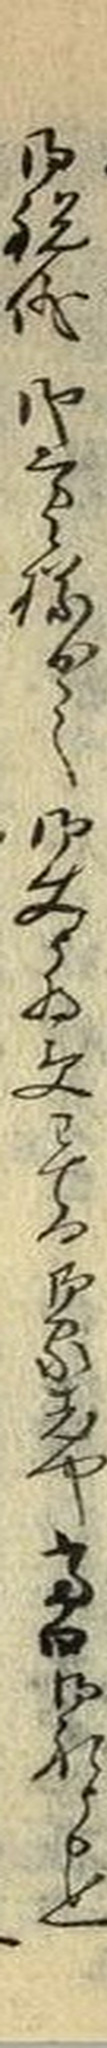御祝儀御方々様ゟ之御使被為受畢而御家老中当日御礼被申上
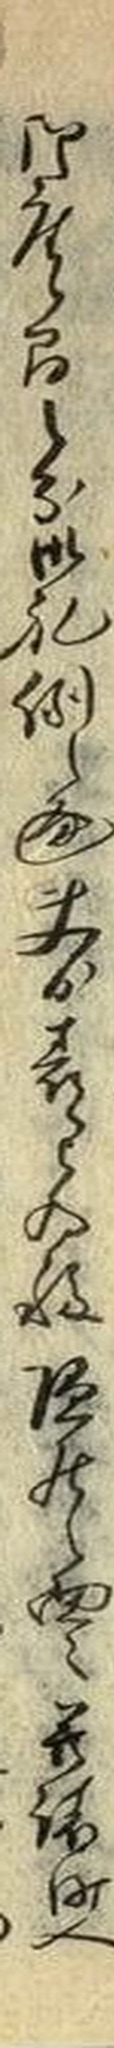御座之間之分御礼例之通夫ゟ表へ被為移隠居之面々幷諸町人
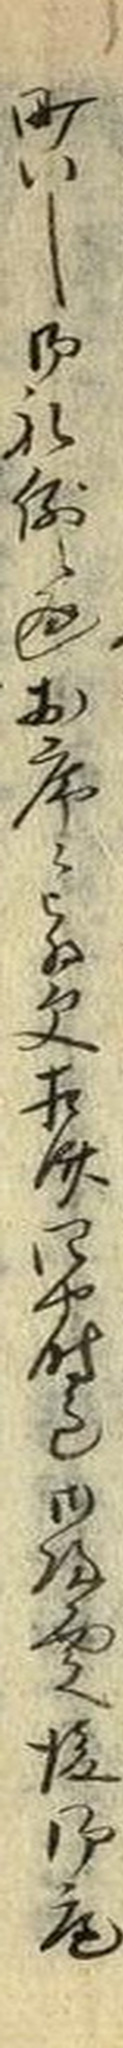町いし御礼例之通於席々被為受相済四半時過御帰殿後御庭
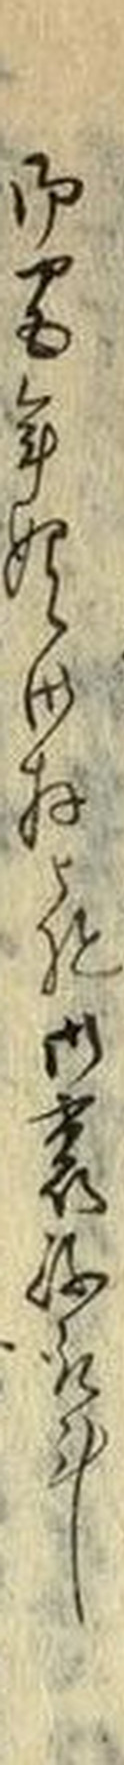御宮年始之御拝被遊御裏役取計
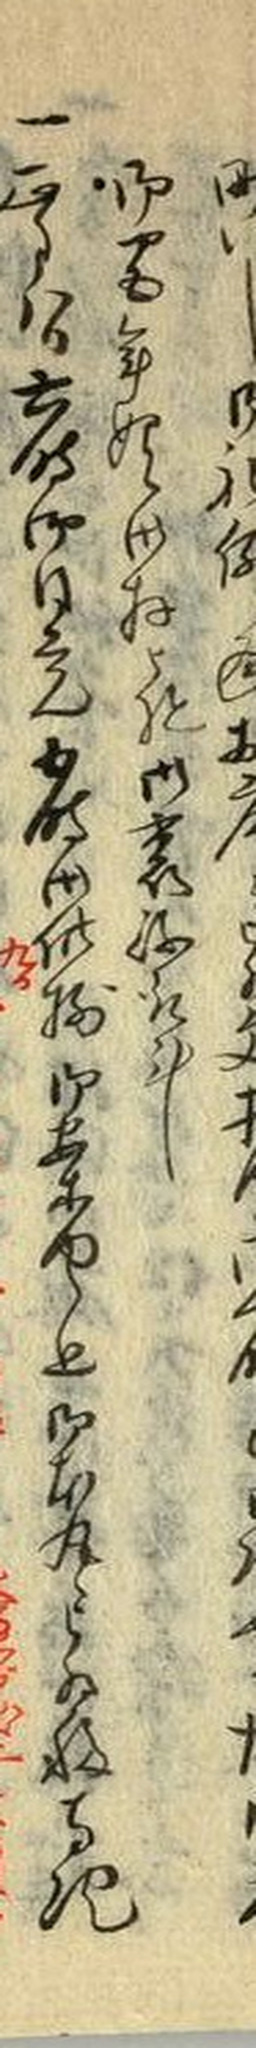一正月八日六時御目覚五時御供揃御案内之上御本丸へ被為移寺院
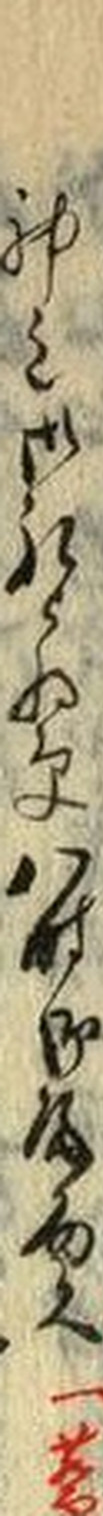神主御礼被為受八時御帰殿
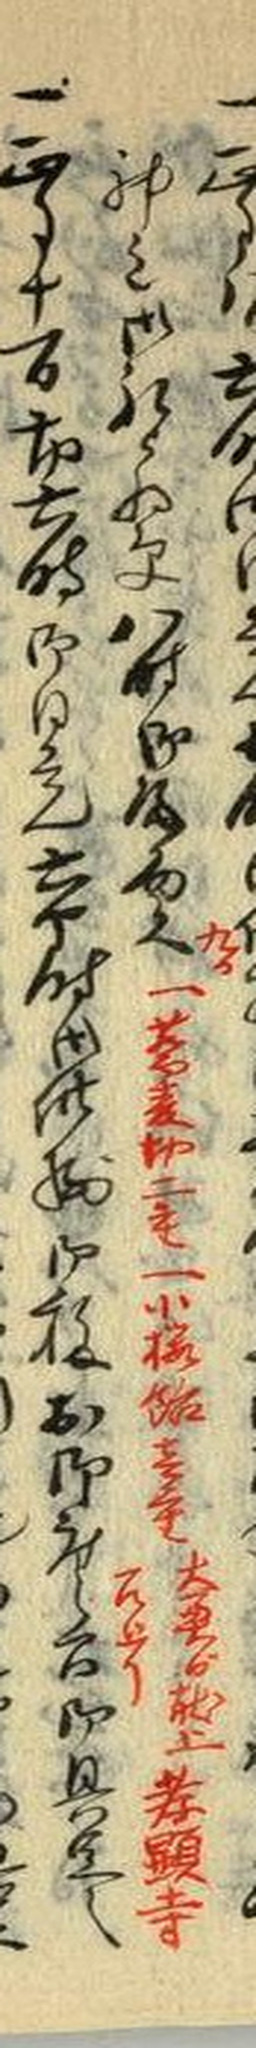一正月十一日切六時御目覚六半時御供揃御移於御座之間御具足之
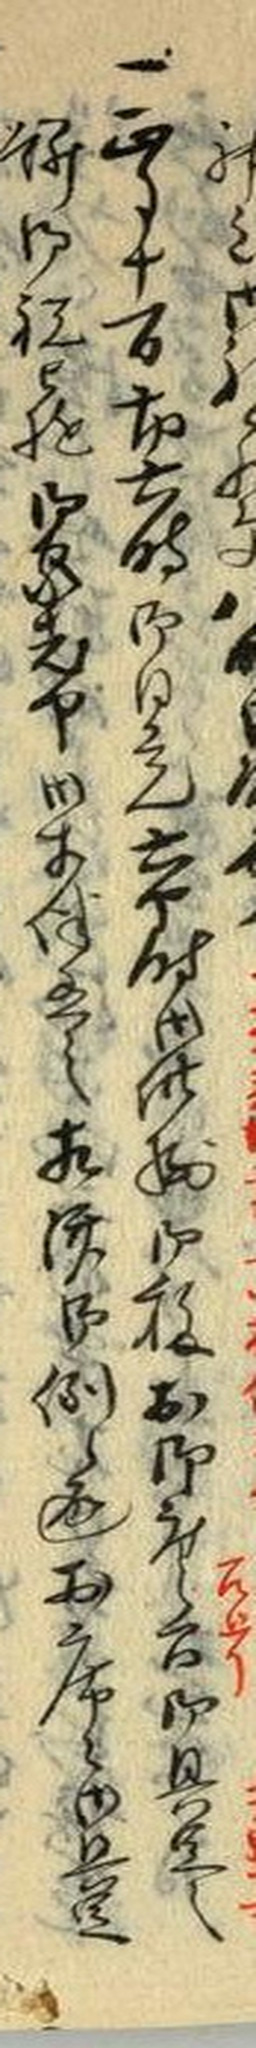餅御祝被遊御家老中御相伴有之相済御例之通於席々御具足
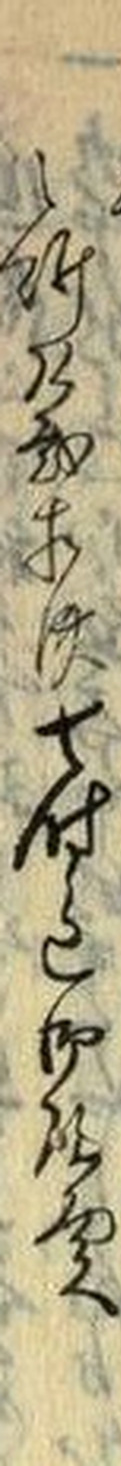之餅頂戴相済七時過御帰殿
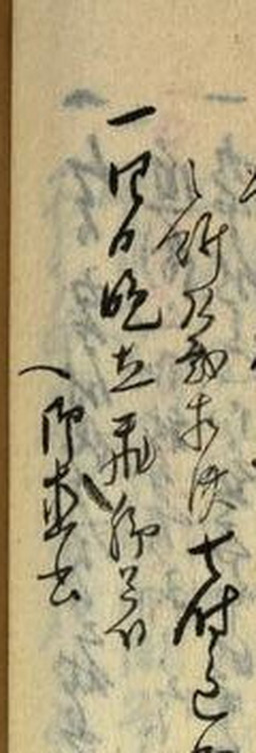一四日晩立飛脚着
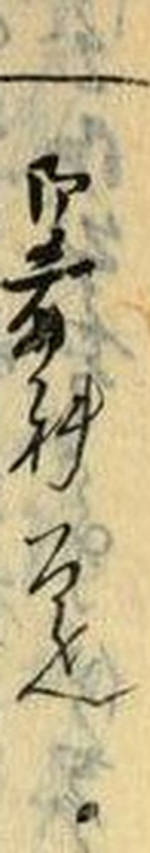御肴料百疋
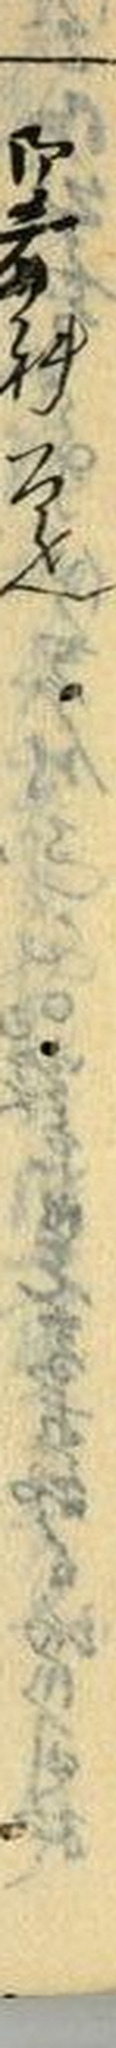御肴料百疋
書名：少傅日録抄（斉承付側向頭取日記、在国）
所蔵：福井県文書館 Fukui Prefectural Archives
